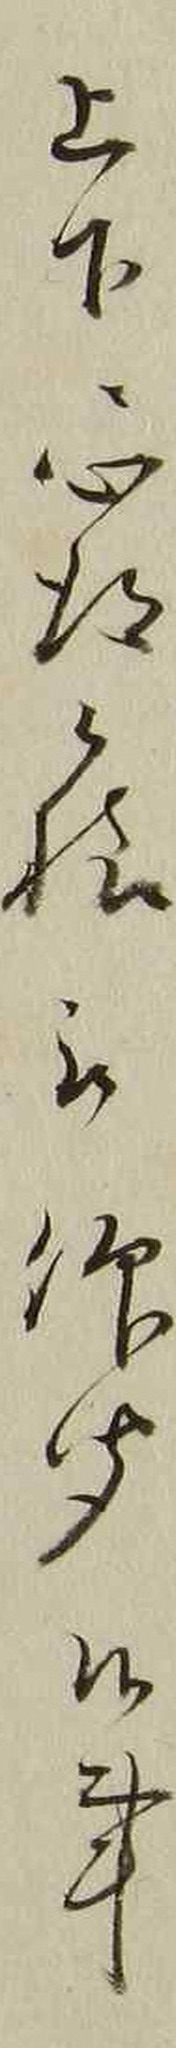上下ニ心得候様被仰聞候事
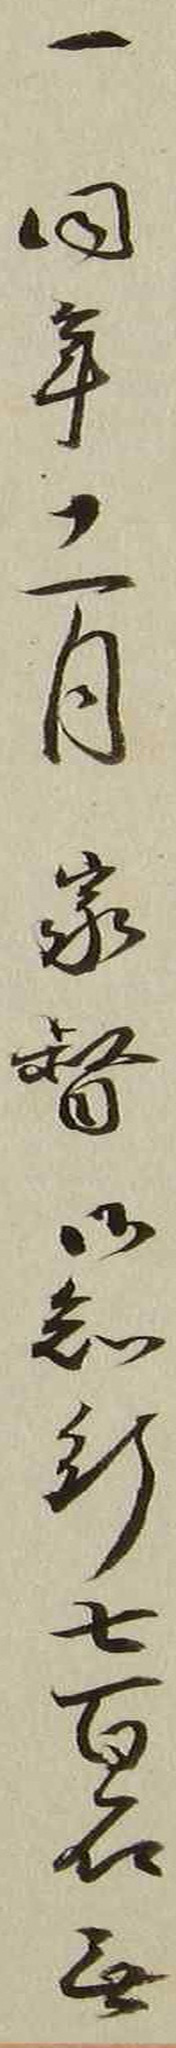一同年十一月家督御知行七百石無
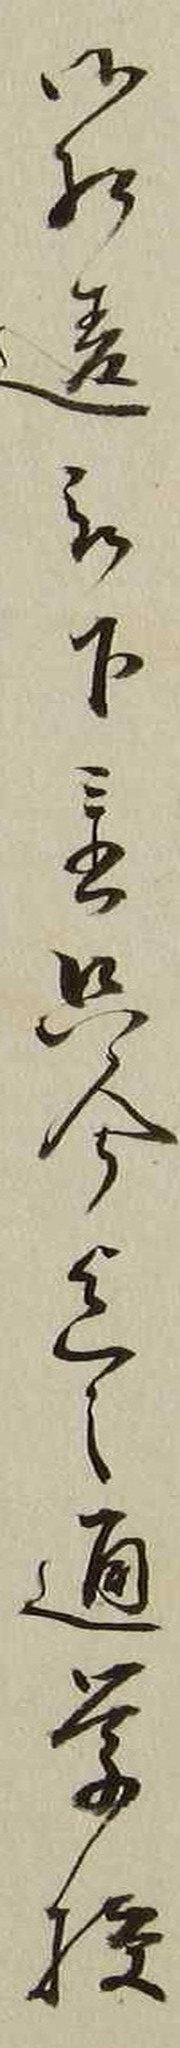御相違被下置只今迄之通学校
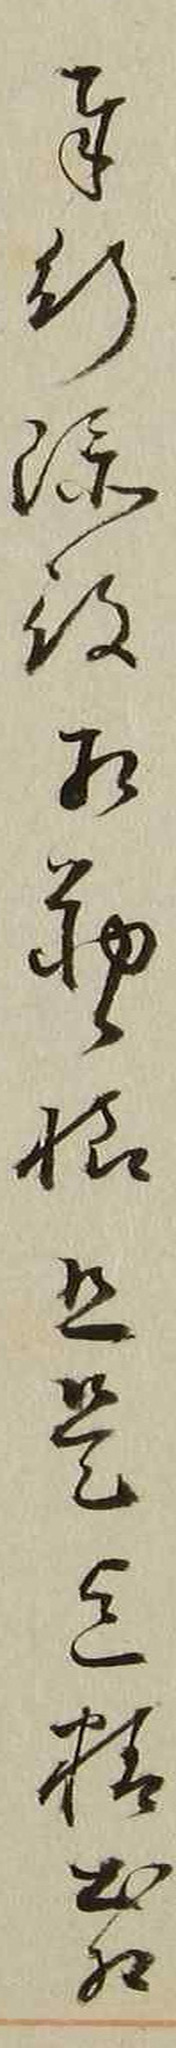奉行添役相勤候様且是迄精出相
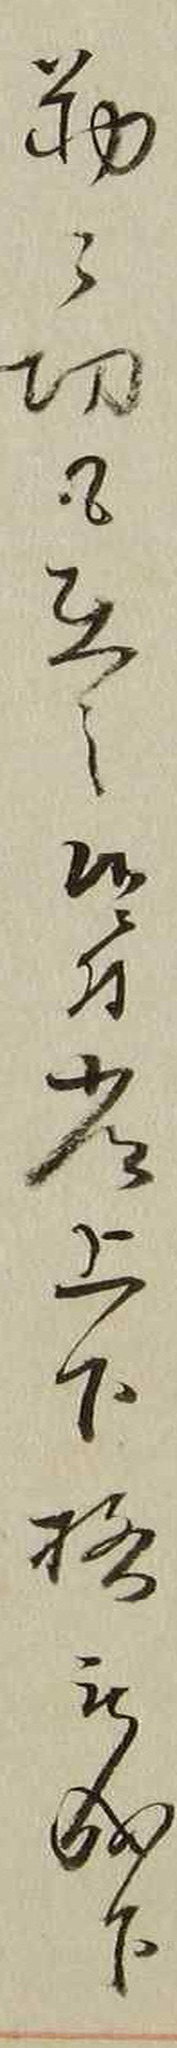勤之功も在之候ニ付常上下格被成下
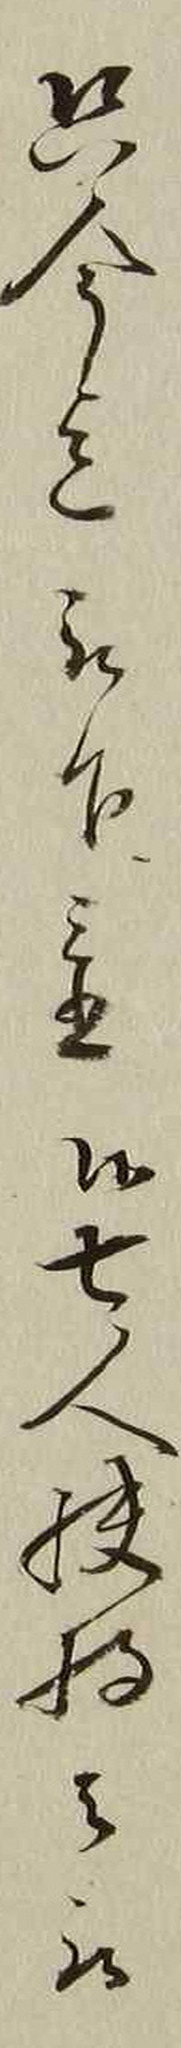只今迄被下置候七人扶持者被
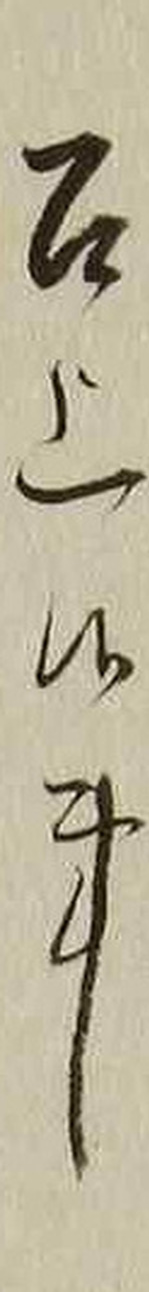召上候事
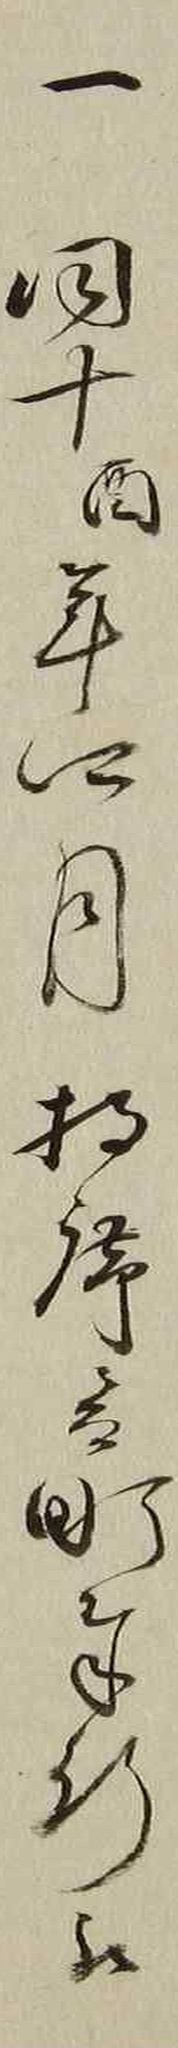一同十酉年四月持席ニ而町奉行被
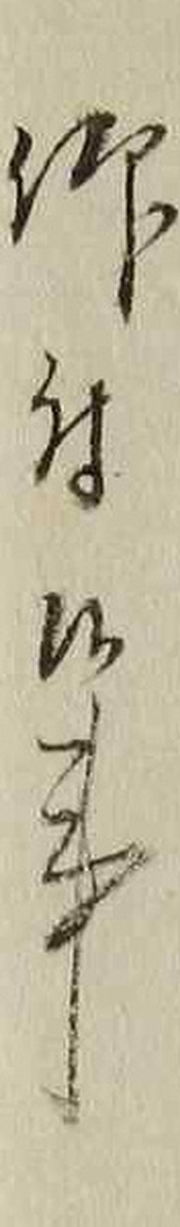仰付候事
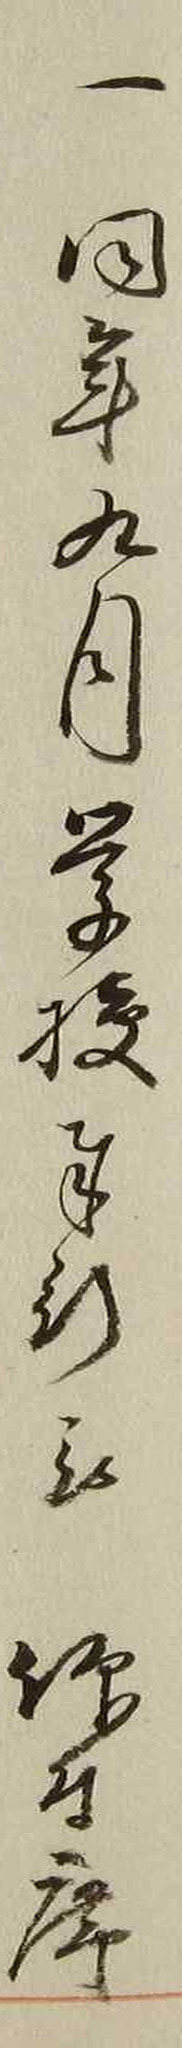一同年九月学校奉行被仰付席
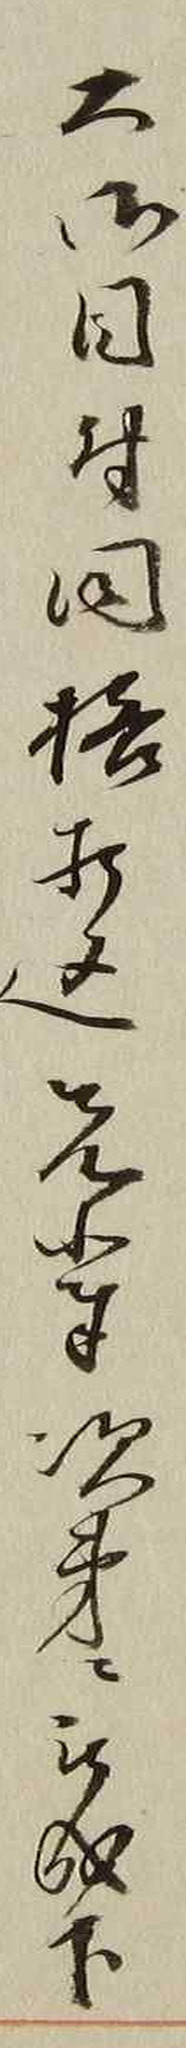大御目付同格打込先輩次第ニ被成下
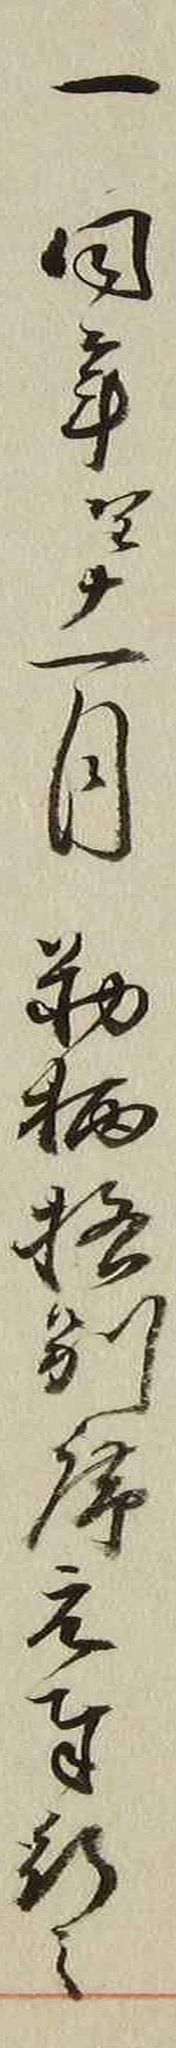一同年閏十一月勤柄格別席元奉行之
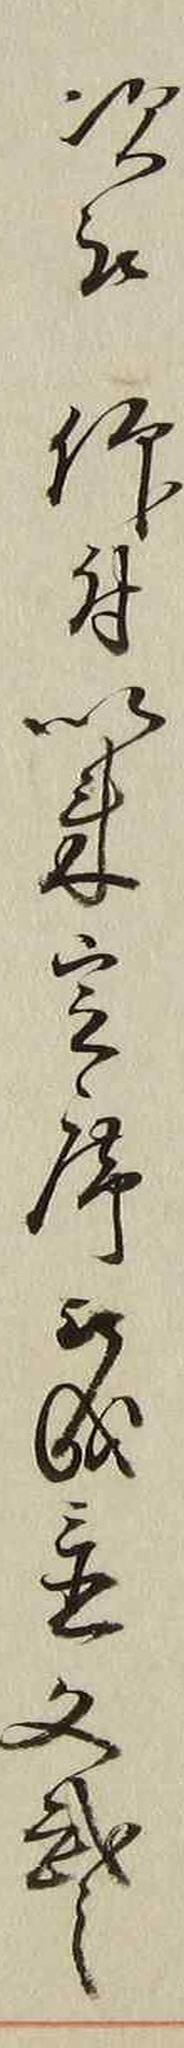次被仰付以来定席被成置文武之
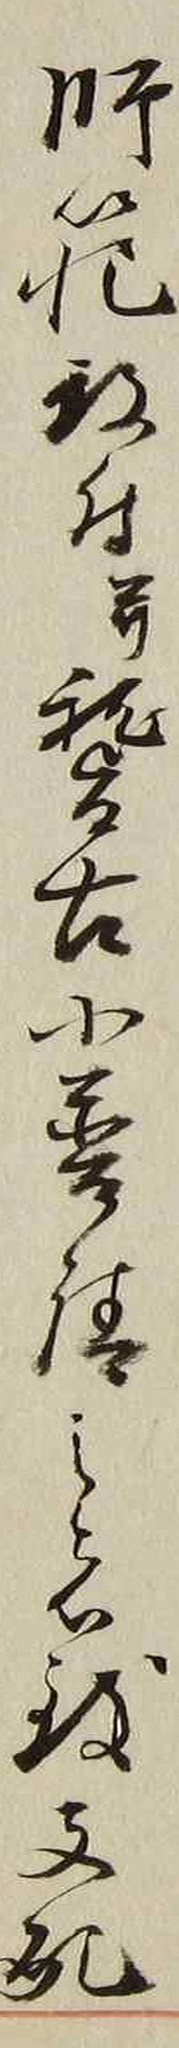師範役付并稽古小普請之者致支配
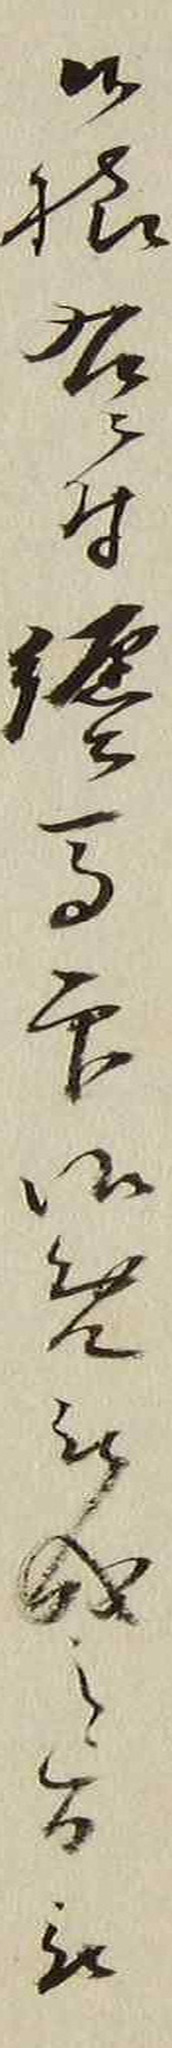候様右ニ付纏馬印御免被成候旨被
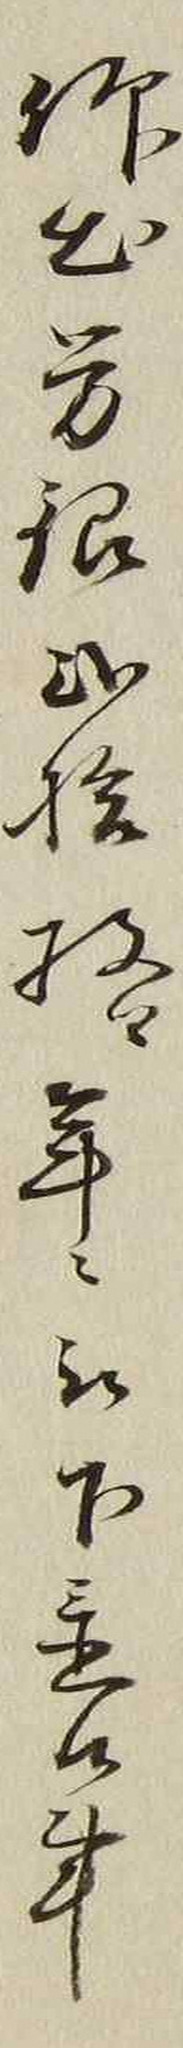仰出労銀拾枚を年々被下置候事
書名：諸士系譜　巻之204　や之部1
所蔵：会津若松市立会津図書館
